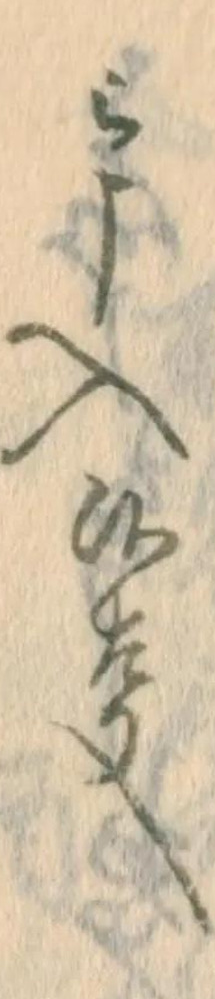被申入候事
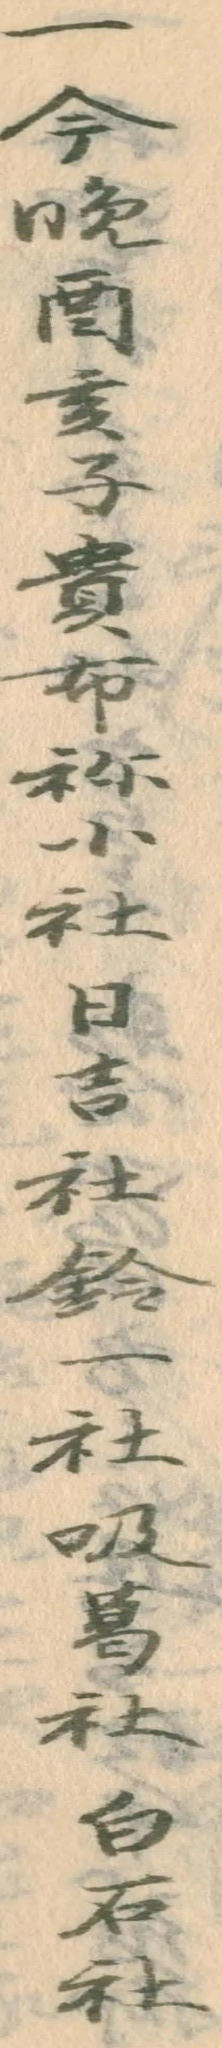一今晩酉亥子貴布祢小社日吉社鈴一社吸葛社白石社
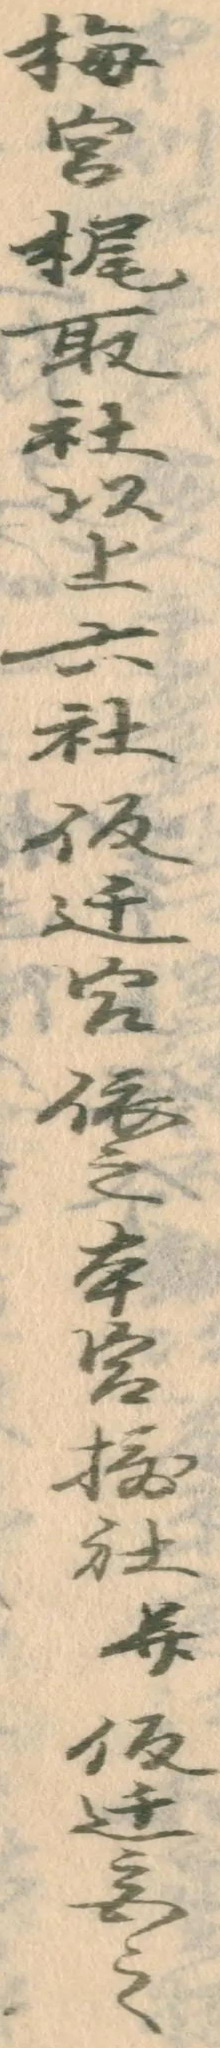梅宮梶取社以上六社仮迁宮依之本宮摂社并仮迁宮之
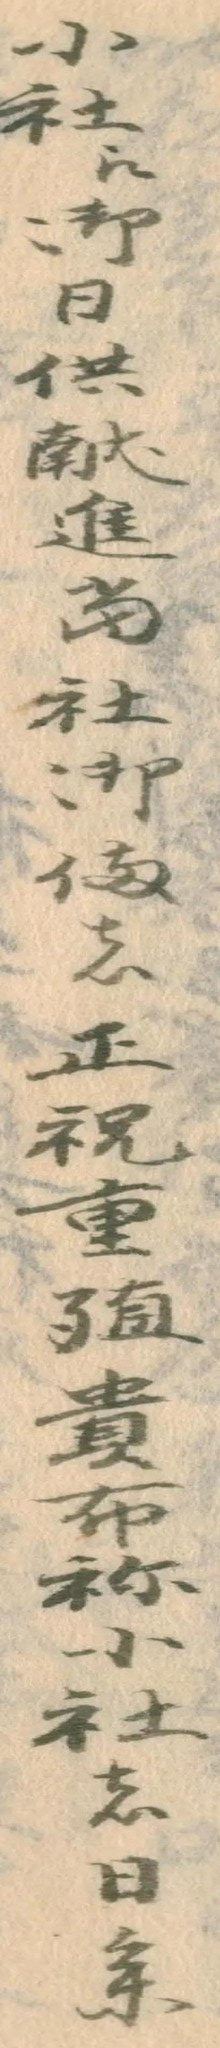小社江御日供献進当社御備は正祝重殖貴布祢小社は日参
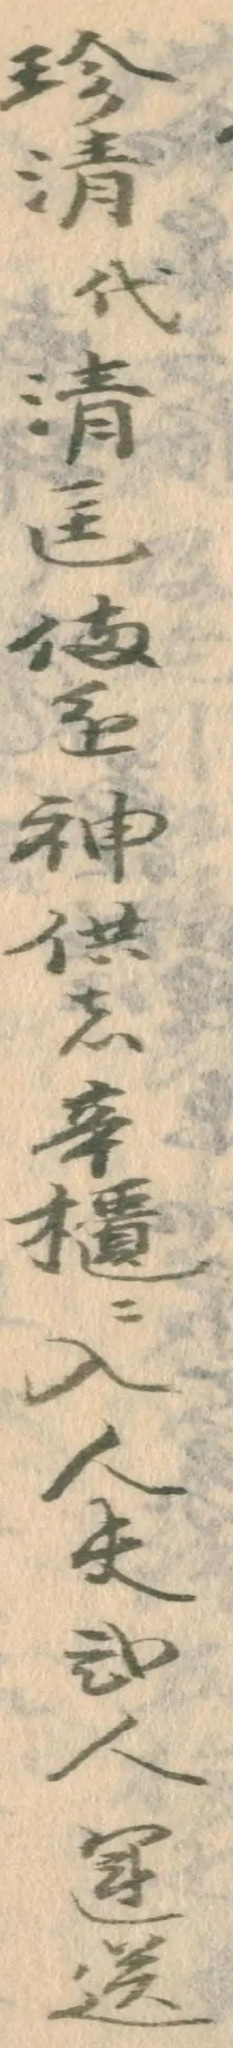珍清代清匡備進神供は辛櫃ニ入人夫弐人運送
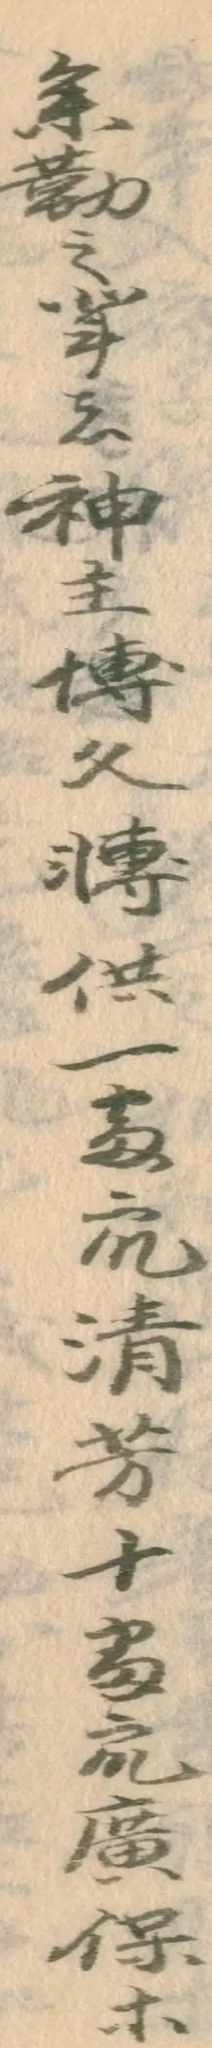一参勤之輩は神主博久転供一番衆清芳十番衆広保等
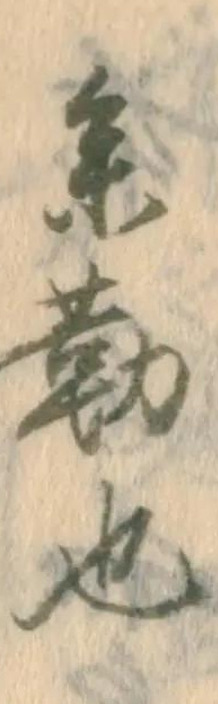参勤也
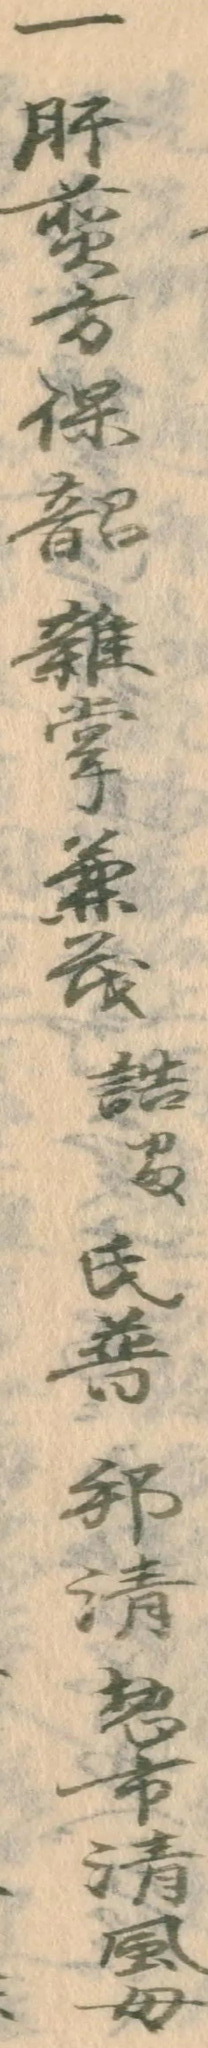一肝煎方保韶雑掌兼茂詰番氏晋邦清惣市清風母
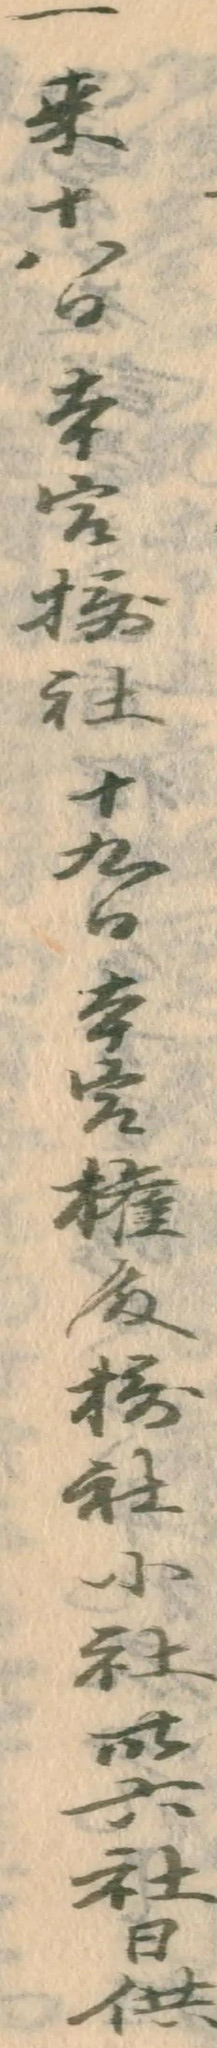一来十八日本宮摂社十九日本宮権殿摂社小社卅六社日供
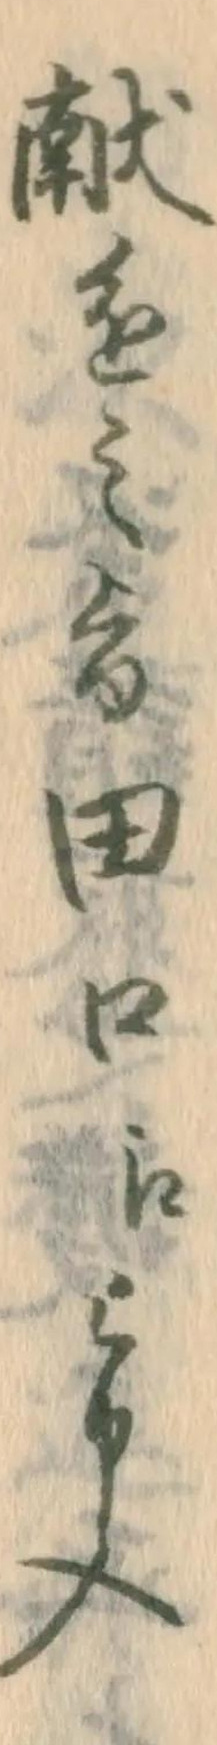献進之旨田口江被申入
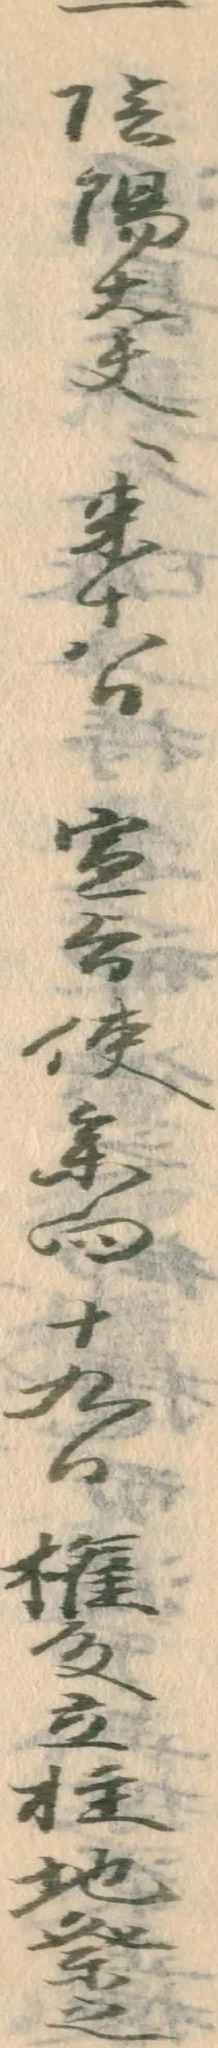一陰陽大夫へ来十八日宣旨使参向十九日権殿立柱地祭之
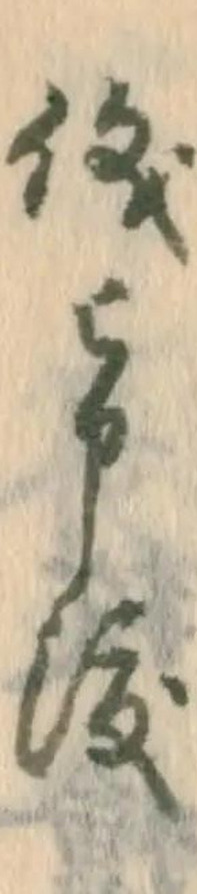儀被申渡
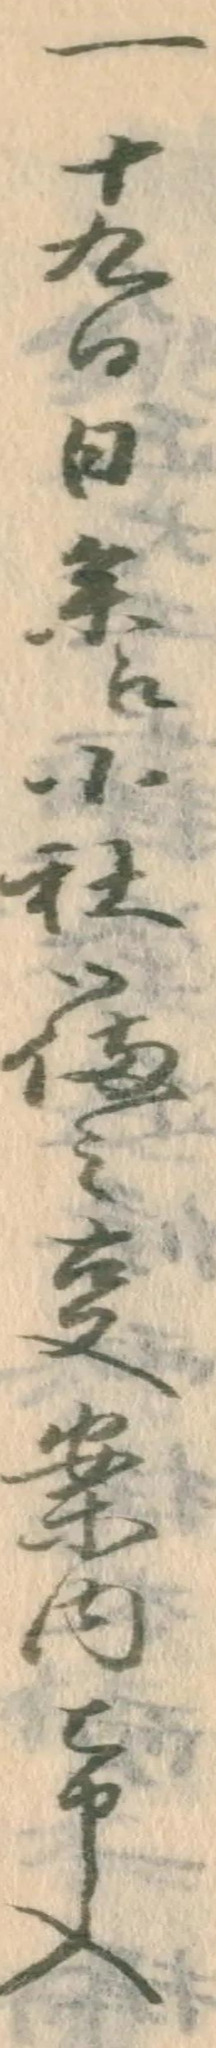一十九日日参江小社御備之事案内被申入
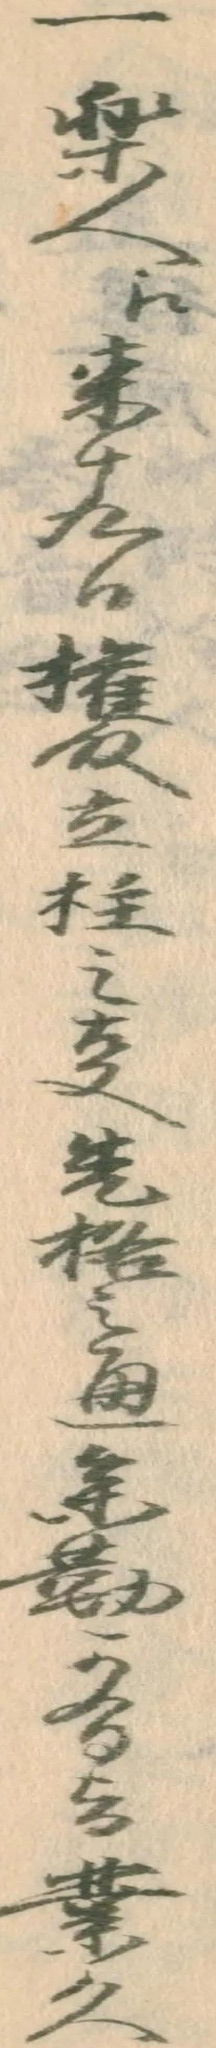一楽人江来十九日権殿立柱之事先格之通参勤可有旨業久
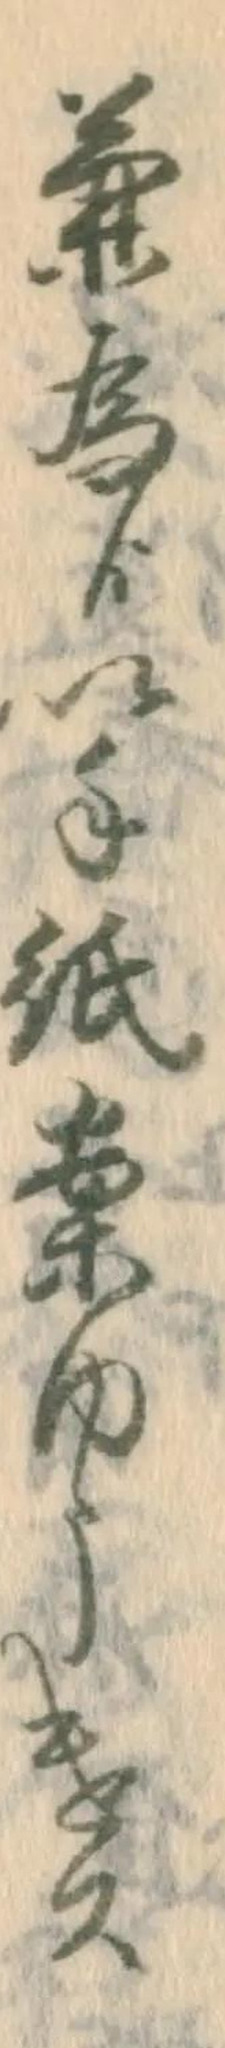兼為ゟ以手紙案内申遣ス
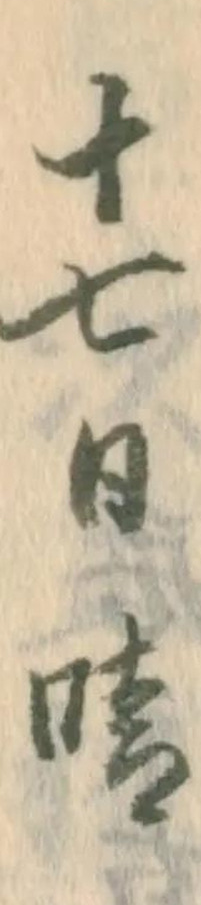十七日晴
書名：賀茂社記録. 第17冊
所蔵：国立国会図書館 National Diet Library, JAPAN
